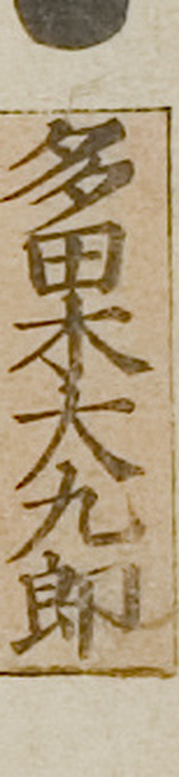●多田木大九郎
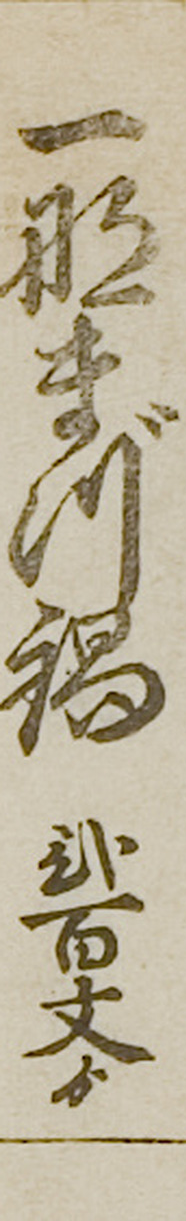一なまず鍋弐百文ゟ
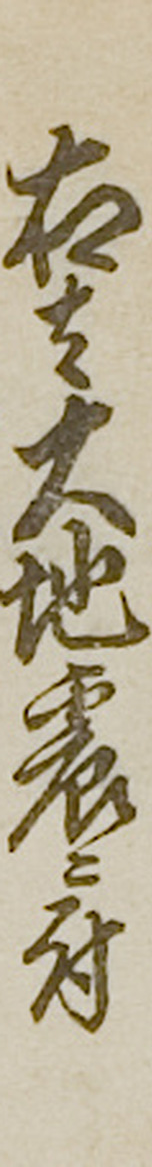右は大地震ニ付
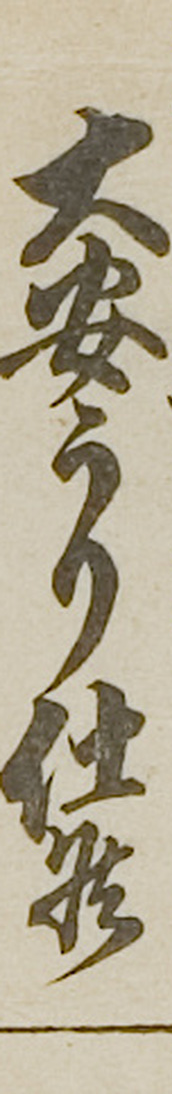大安うり仕候
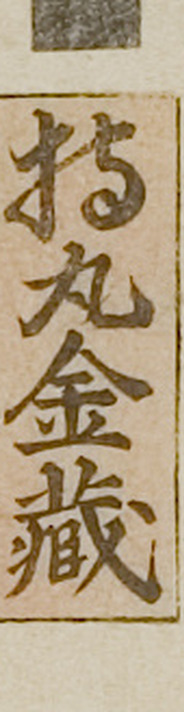持丸金蔵
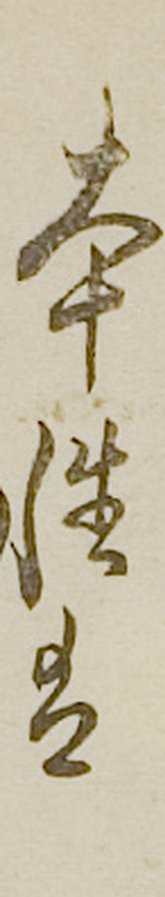本性は
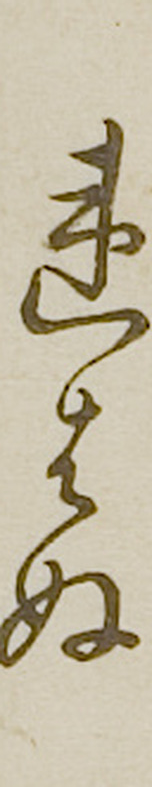違はぬ
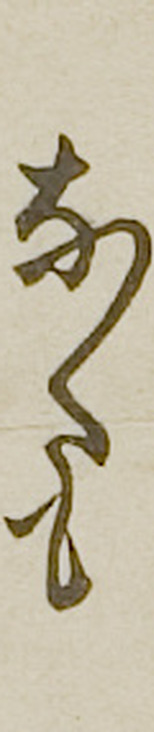なくも
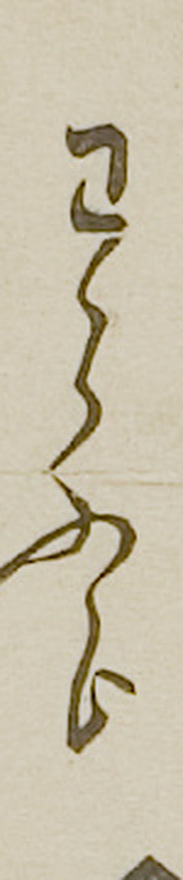わらふも
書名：[多田木大九郎・持丸金蔵・鬼瓦平三の三人生酔]
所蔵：東京大学総合図書館 General Library in the University of Tokyo, JAPAN
